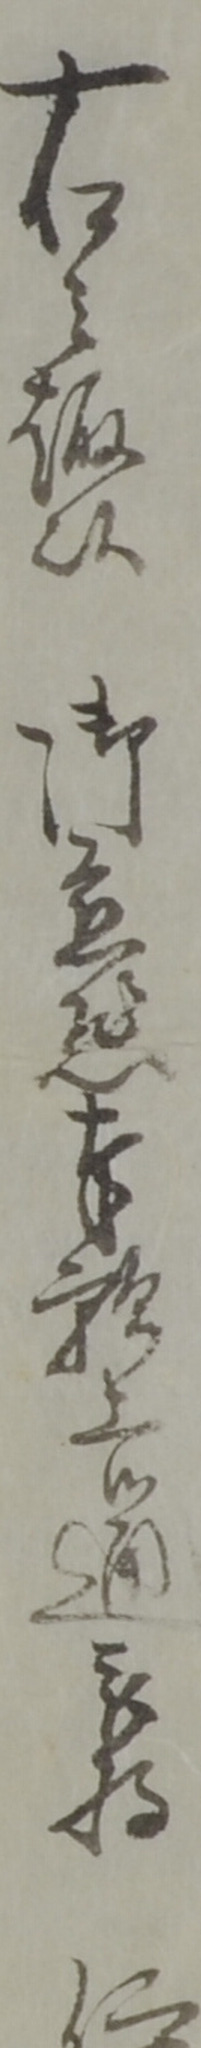右之趣以御慈悲奉願上候通被為仰付
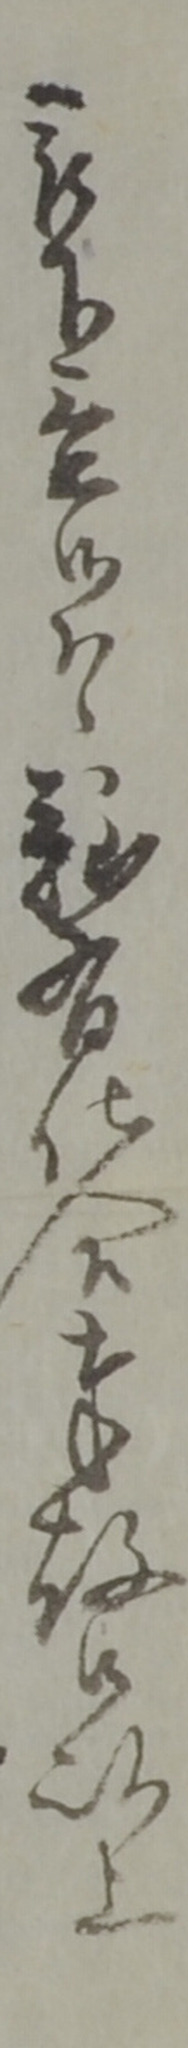被下置候ハヽ難有仕合奉存候以上
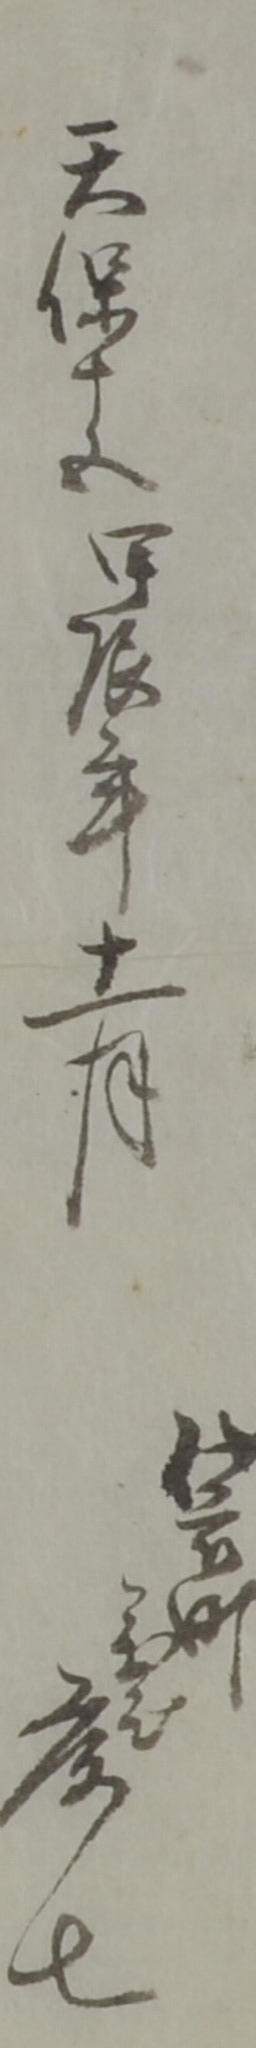天保十五甲辰年十一月玉屋
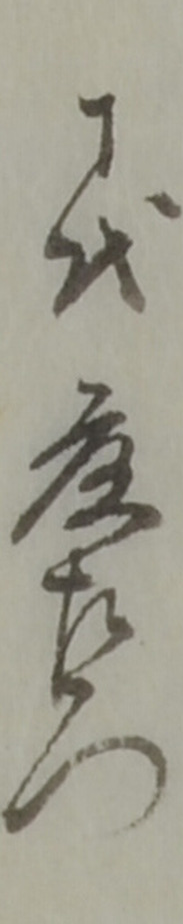丁代藤左衛門
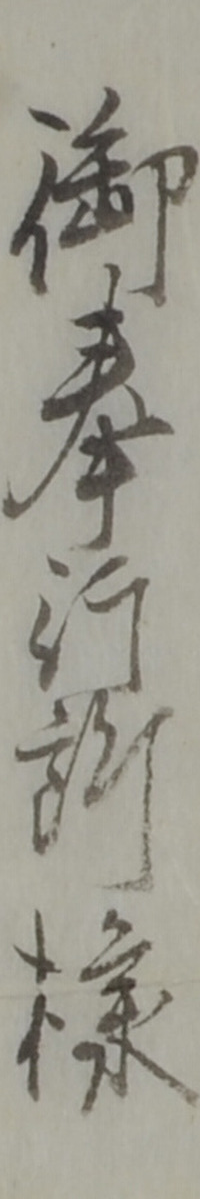御奉行所様
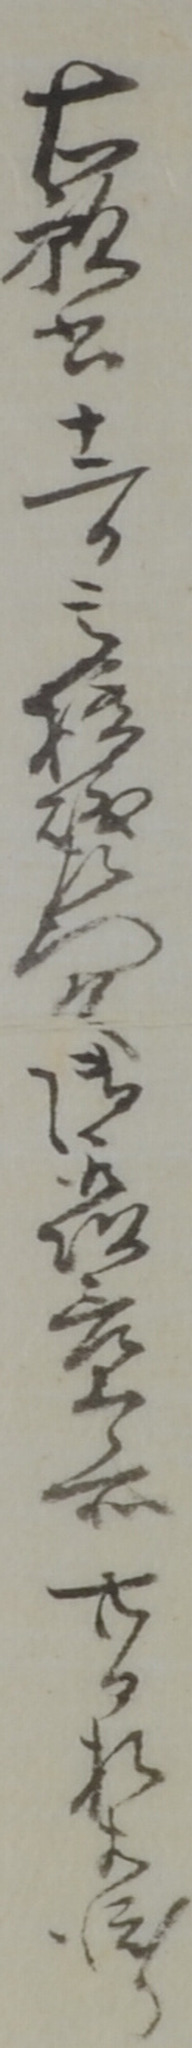右願書十二日高橋磯左衛門殿御取次差上候所廿日札相渡り
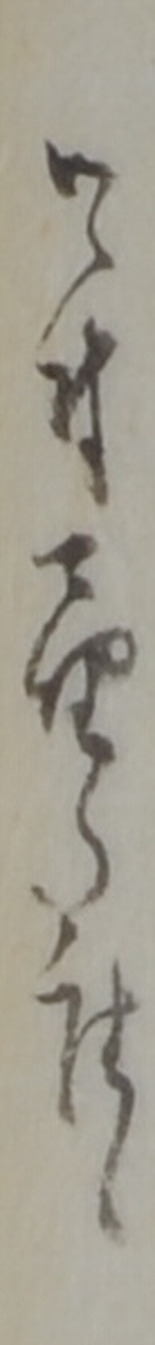候ニ付届御座候
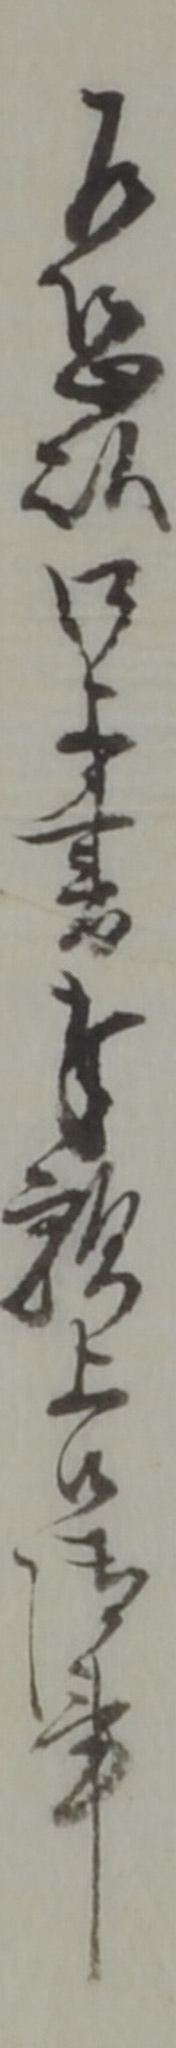乍恐以口上書奉願上候御事
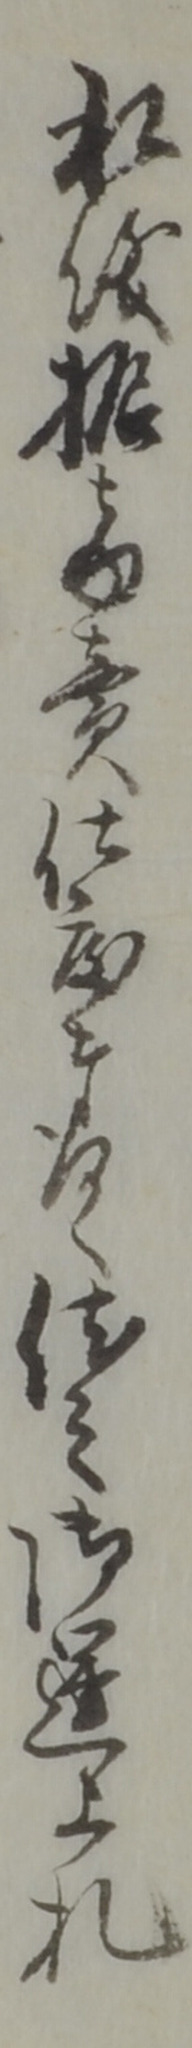私儀振商売仕度奉存候依之御運上札
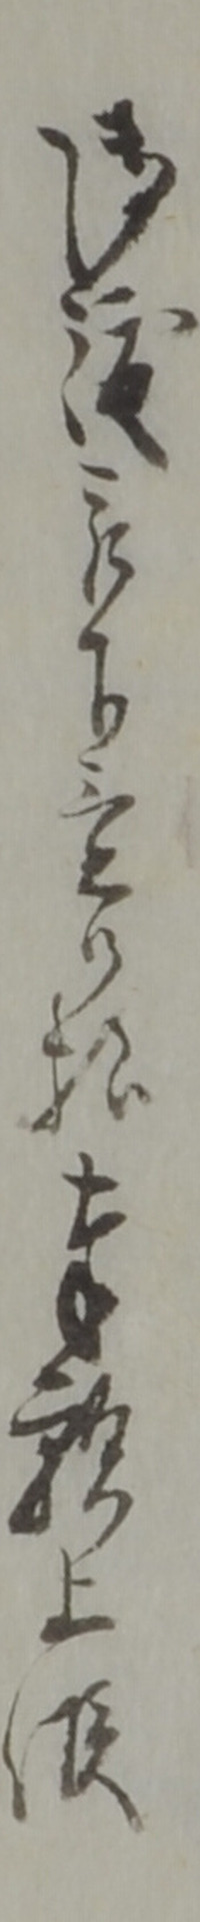御渡被下置候様奉願上候
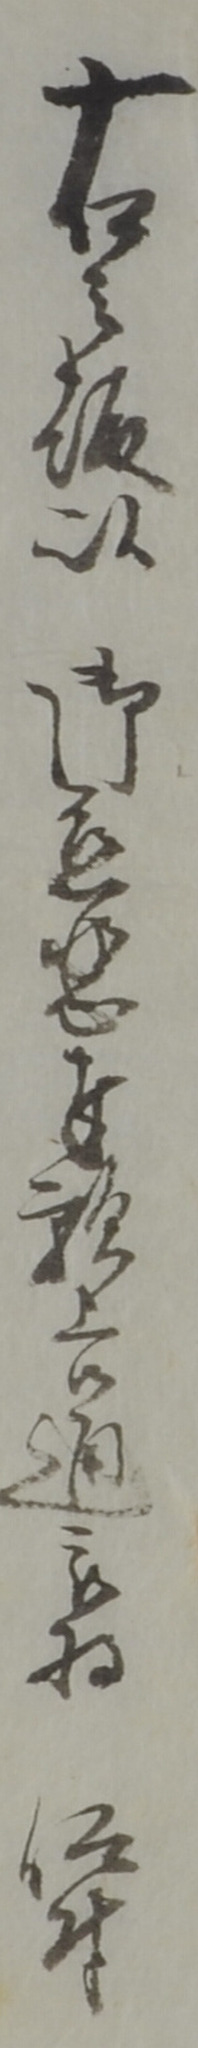右之趣以御慈悲奉願上候通被為仰付
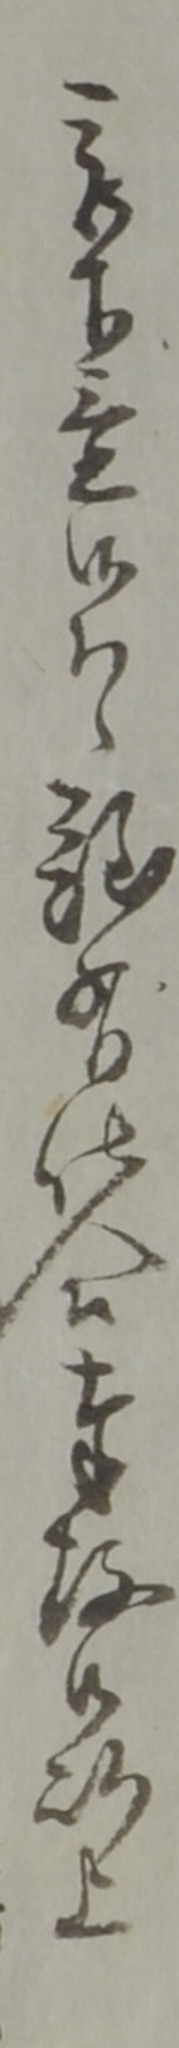被下置候ハヽ難有仕合奉存候以上
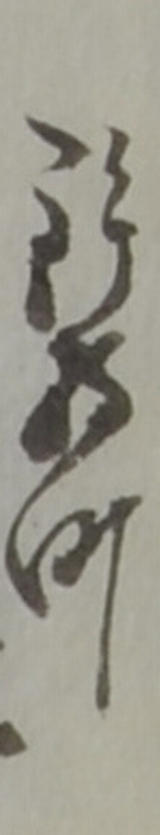鉾持町
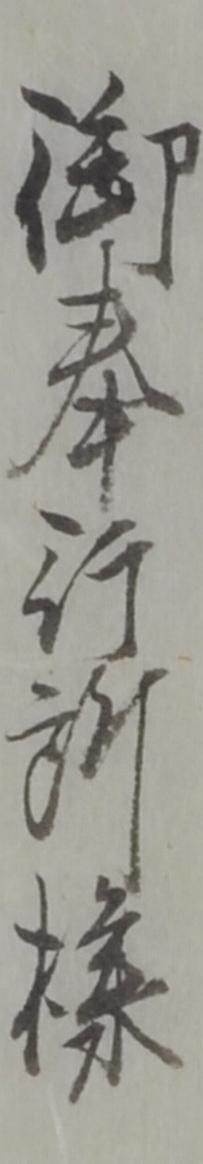御奉行所様
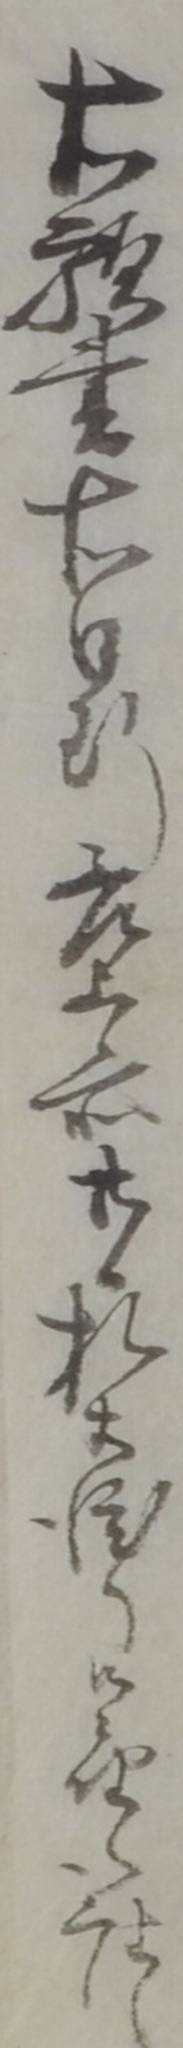右願書右同断差上候所廿日札相渡り御届御座候

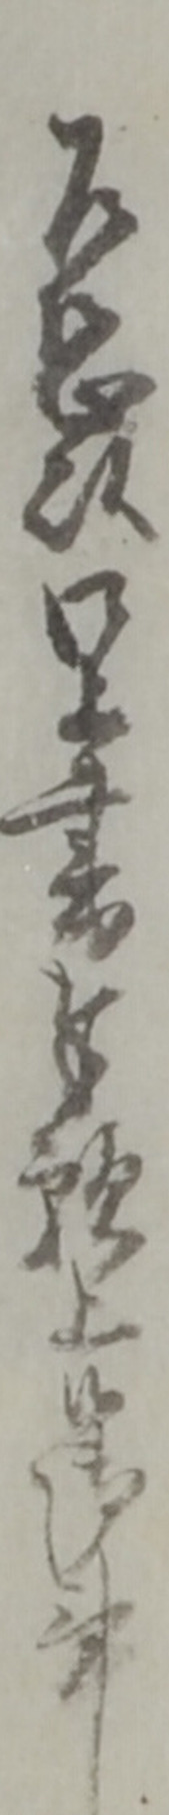乍恐以口上書奉願上候御事
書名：諸願書控簿
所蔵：伊那市立高遠町図書館・合同会社AMANE
